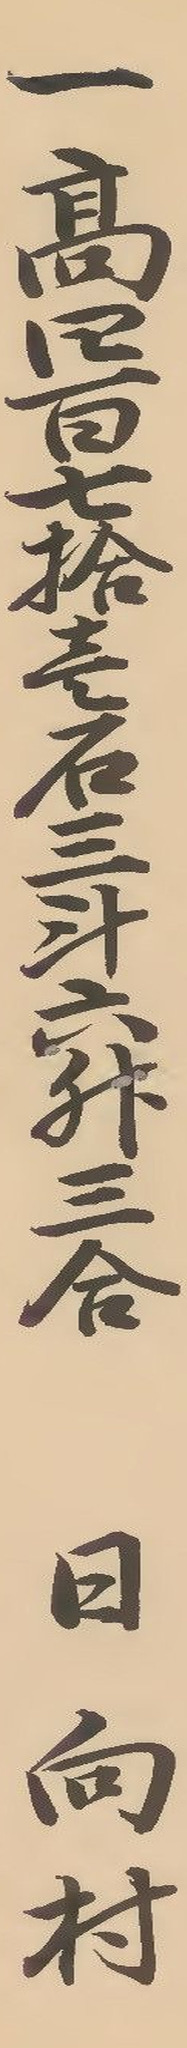一高四百七拾壱石三斗六升三合日向村

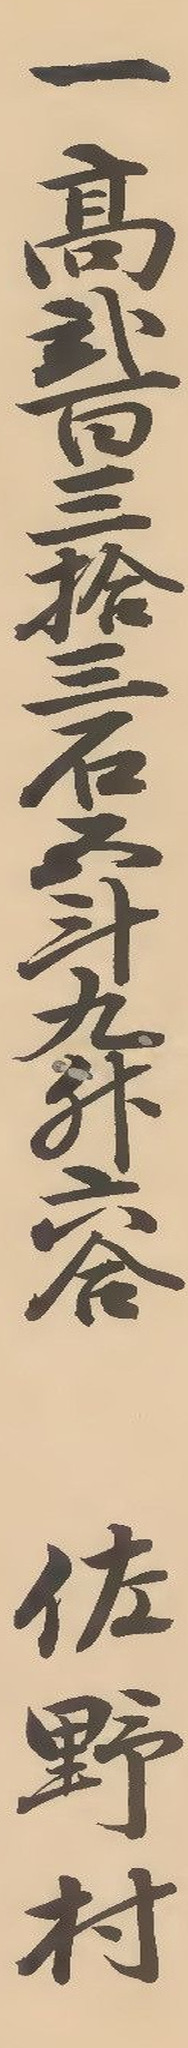一高弐百三拾三石五斗九升六合佐野村
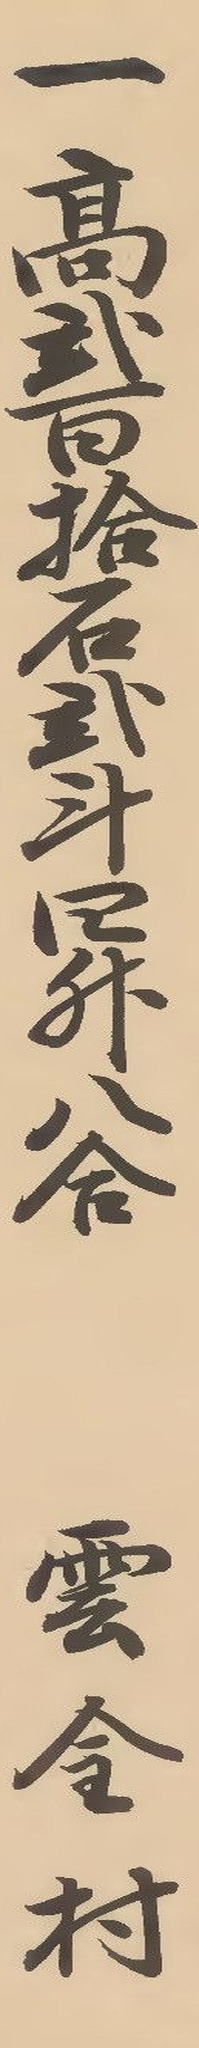一高弐百拾石弐斗四升八合雲金村
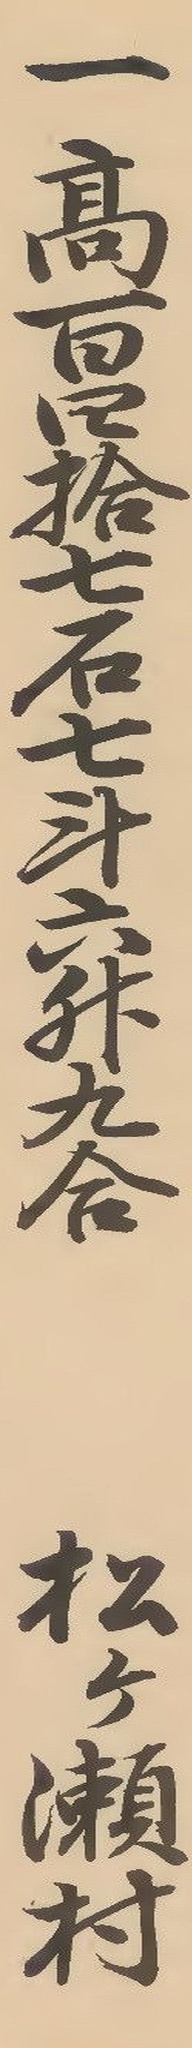一高百四拾七石七斗六升九合松ヶ瀬村
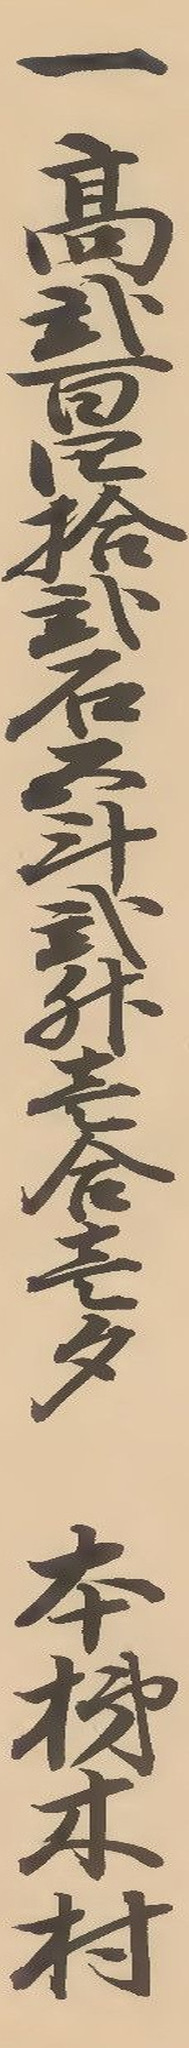一高弐百四拾弐石五斗弐升壱合壱勺本柿木村
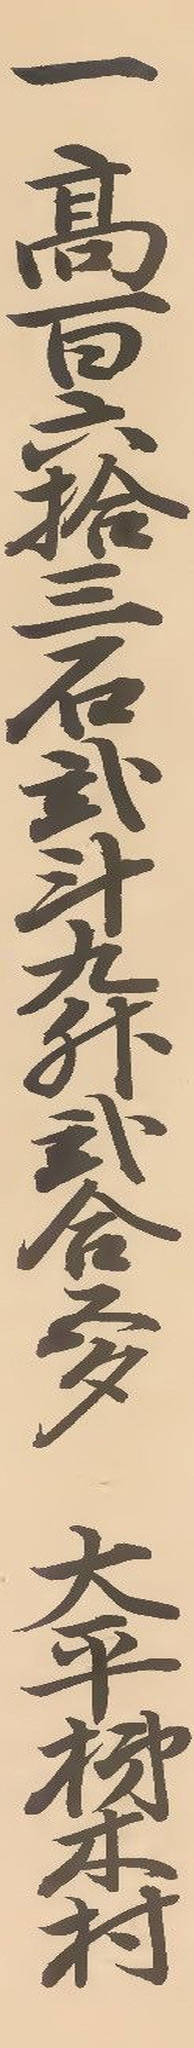一高百六拾三石弐斗九升弐合五勺大平柿木村
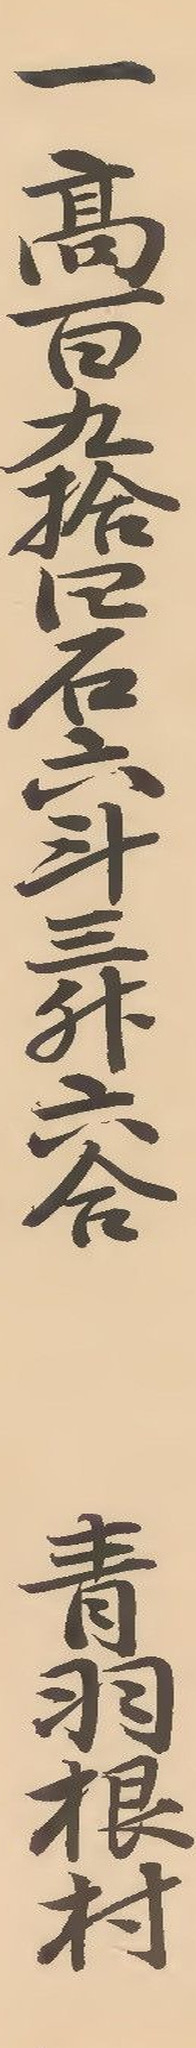一高百九拾四石六斗三升六合青羽根村
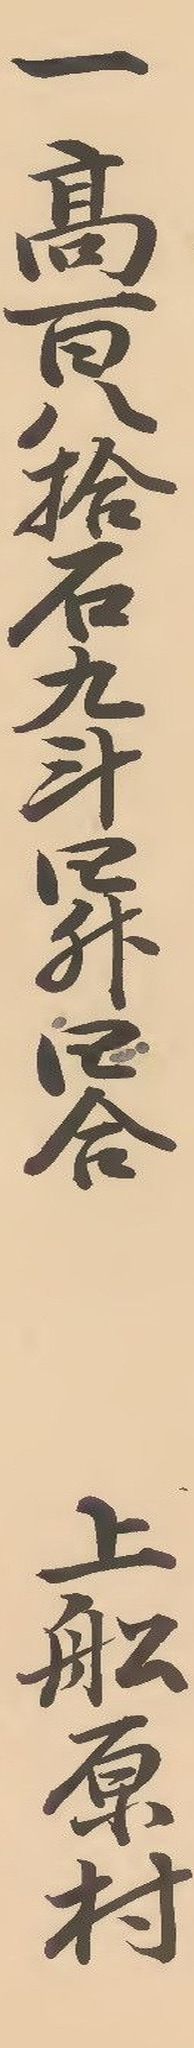一高百八拾石九斗四升四合上船原村

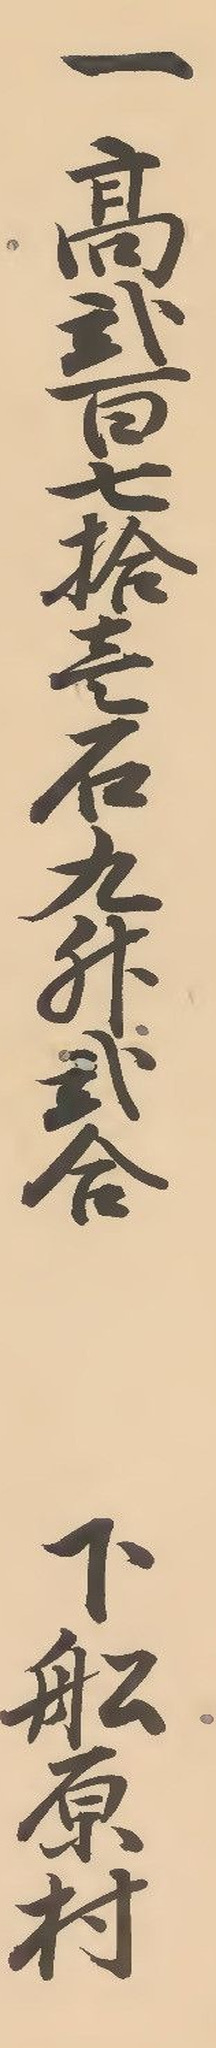一高弐百七拾壱石九升弐合下船原村
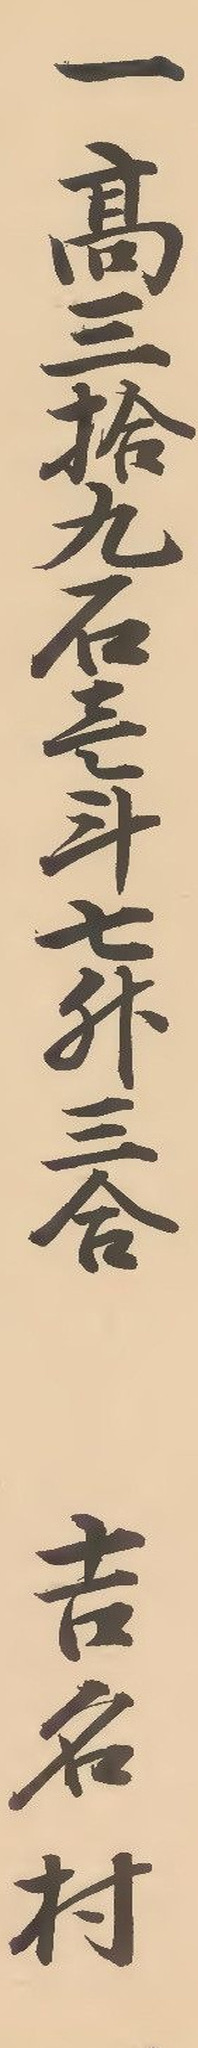一高三拾九石壱斗七升三合吉名村
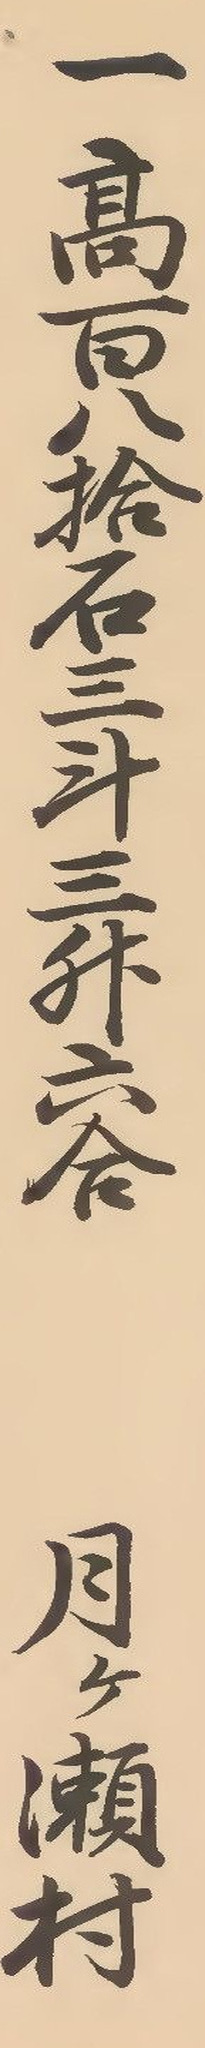一高百八拾石三斗三升六合月ヶ瀬村
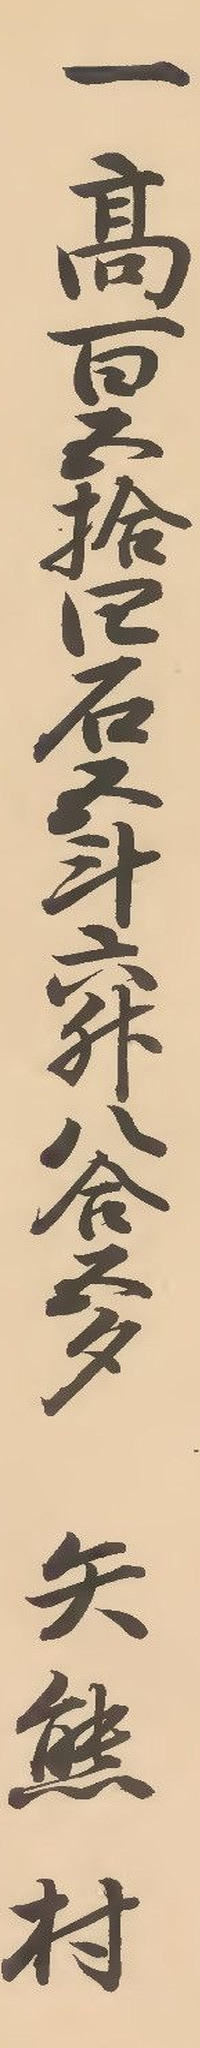一高百五拾四石五斗六升八合五勺矢熊村
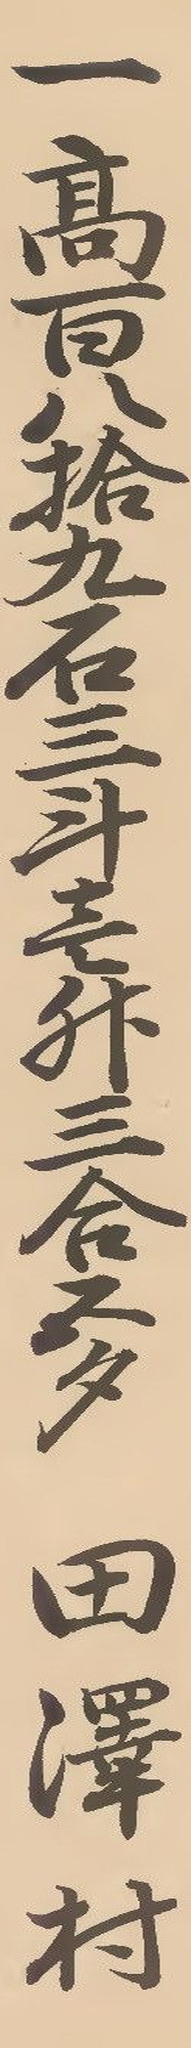一高百八拾九石三斗壱升三合五勺田沢村
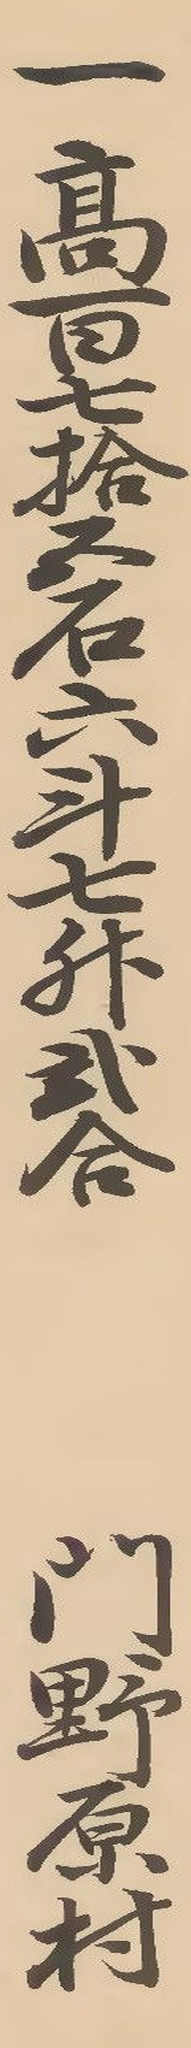一高百七拾五石六斗七升弐合門野原村
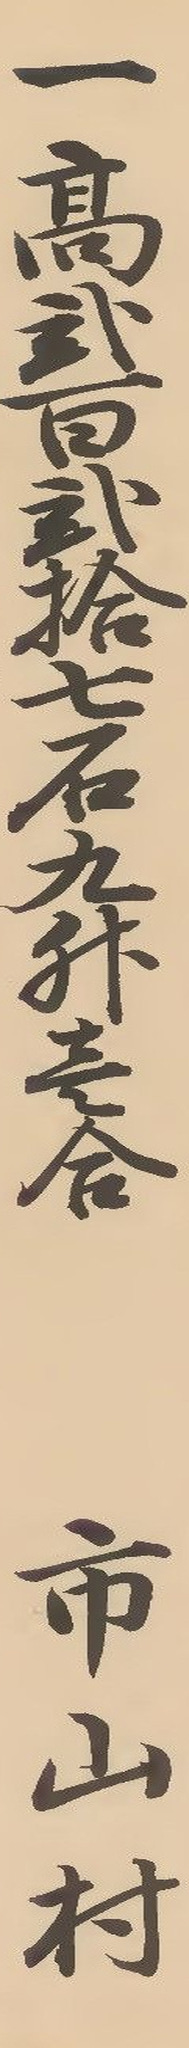一高弐百弐拾七石九升壱合市山村
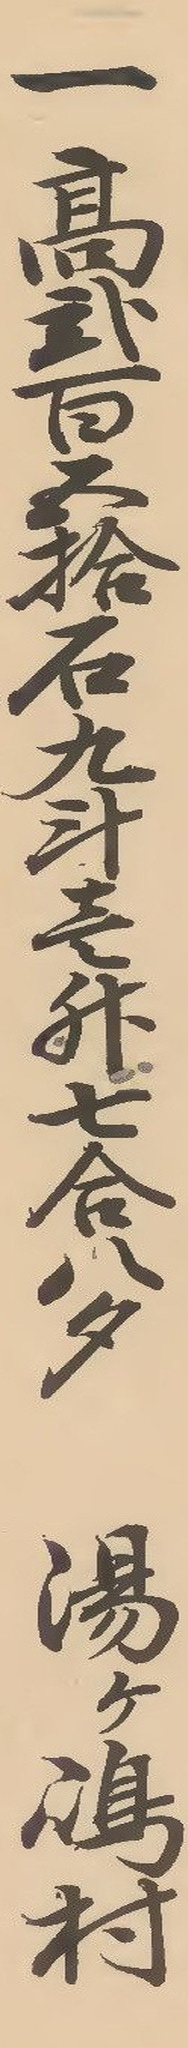一高弐百五拾石九斗壱升七合八勺湯ヶ島村
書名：伊豆国郷帳
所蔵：国立公文書館 National Archives of Japan
